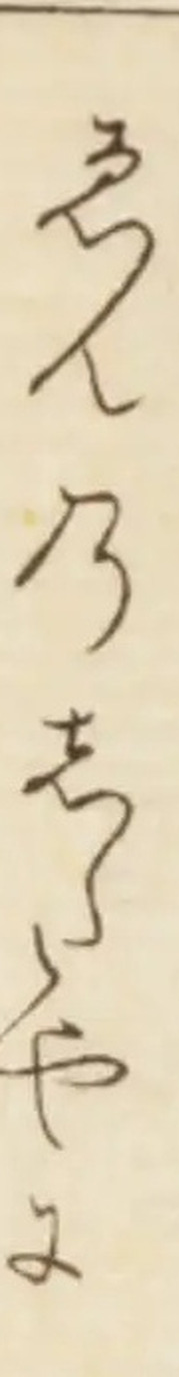ゑんのしたやに
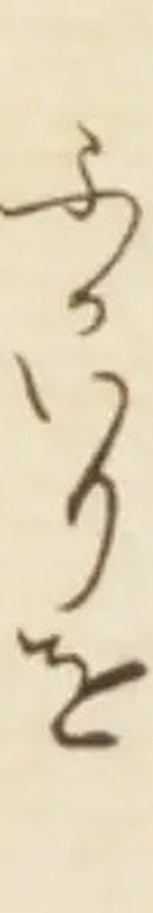ふかいりを
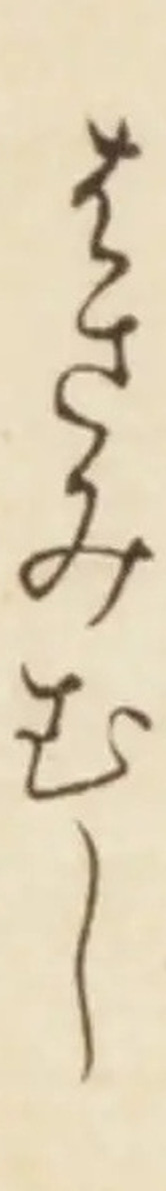はさみむし
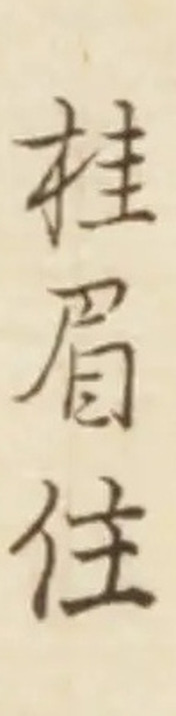桂眉住
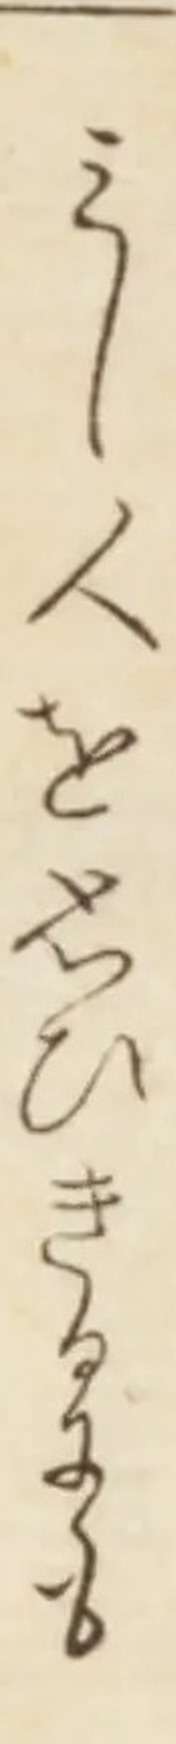みし人を思ひきるにも
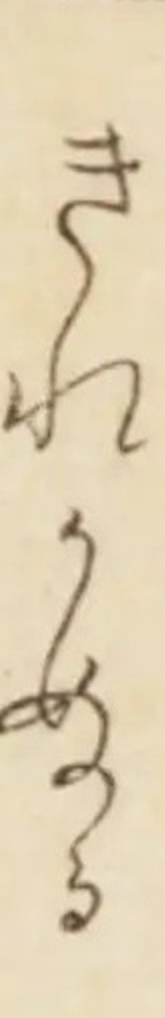きれかぬる
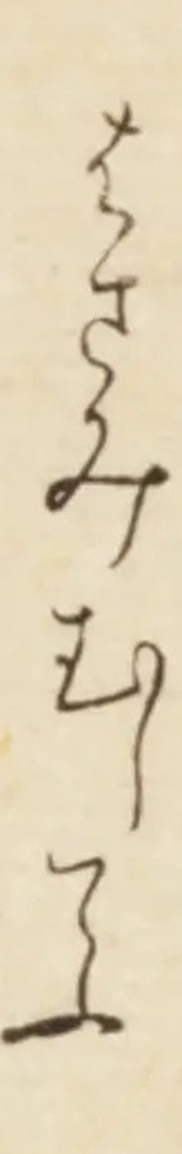はさみむしてふ
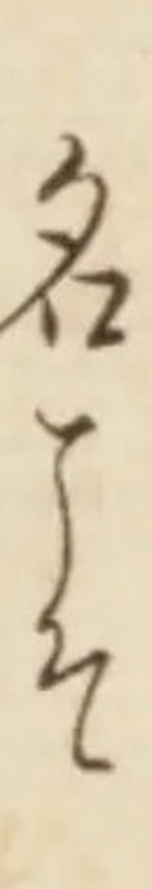名こそ
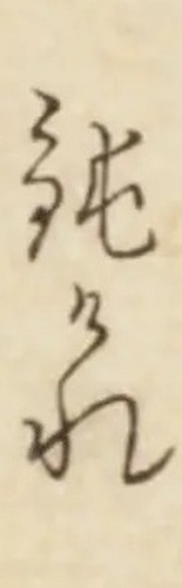鈍けれ

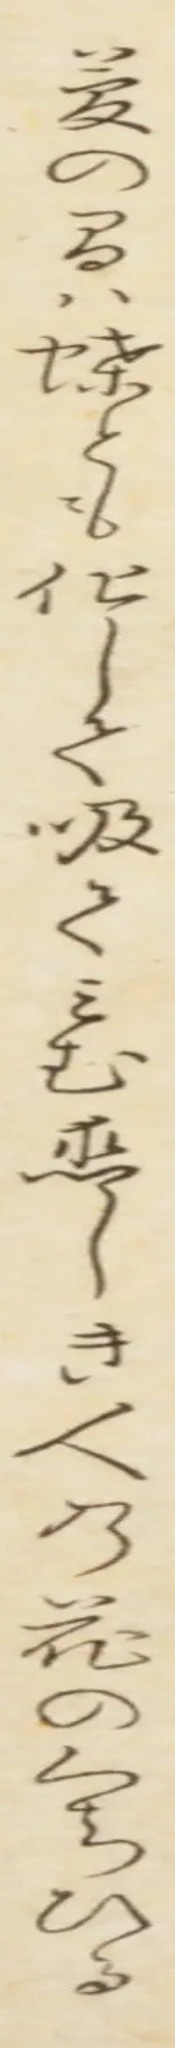夏の間は蝶とも化して吸てみむ恋しき人の花のくちひる
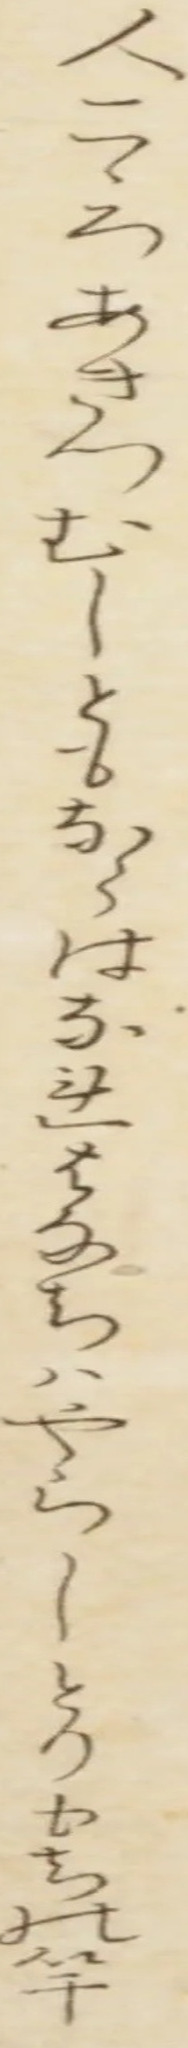人こゝろあきつむしともならはなれはなちはやらしとりもちの竿

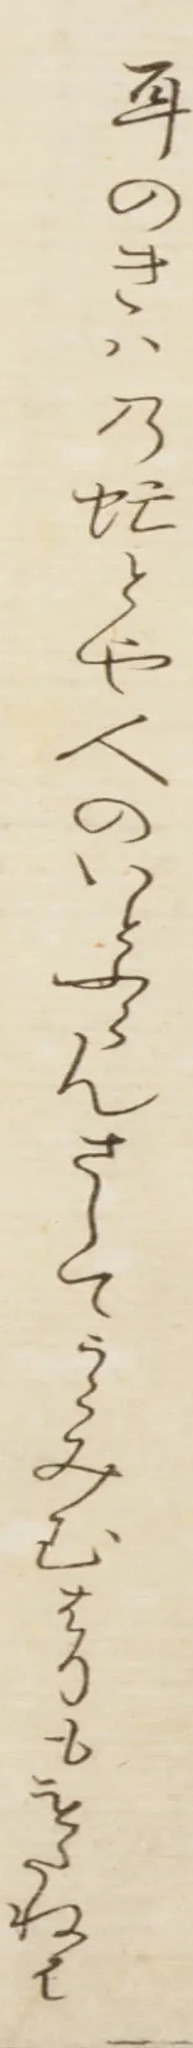耳のきはの虻とや人のいとふらんさしてうらみむはりももたねは
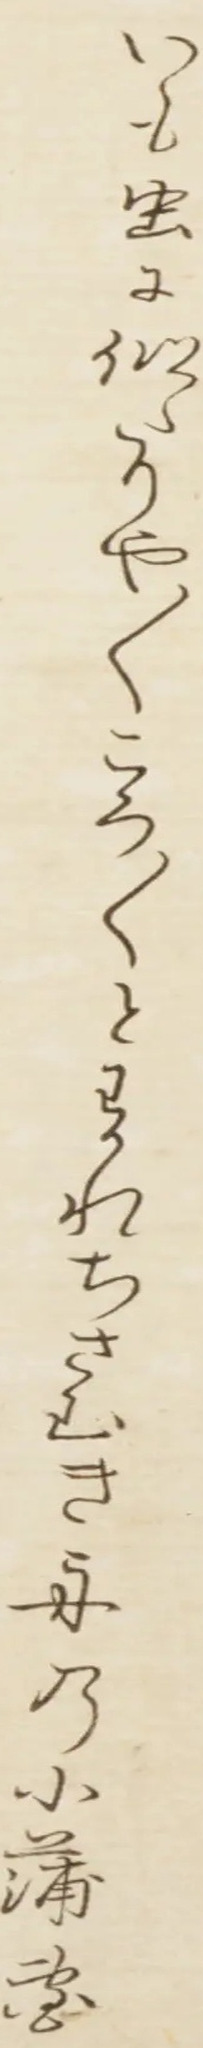いも虫に似たりや〳〵ころ〳〵とわかれちさむき舟の小蒲団

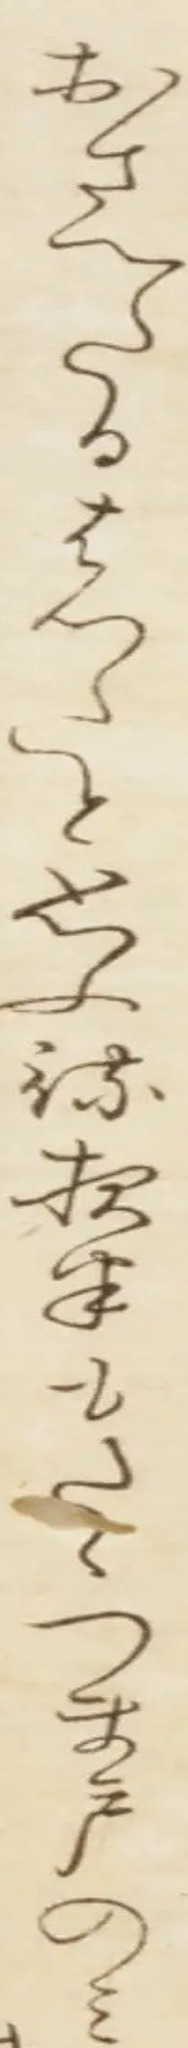おさへたるはつたと思ふ待夜半もたゝつま戸のみ
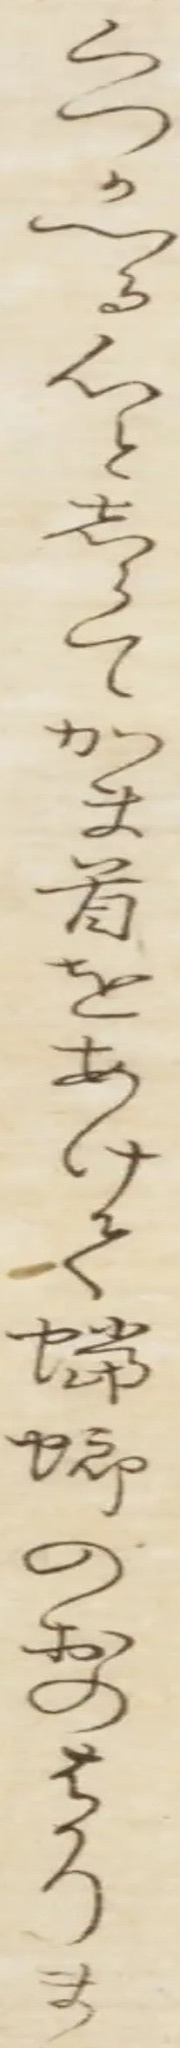くつかへる心としらてかま首をあけて蟷螂のおのはかりまつ

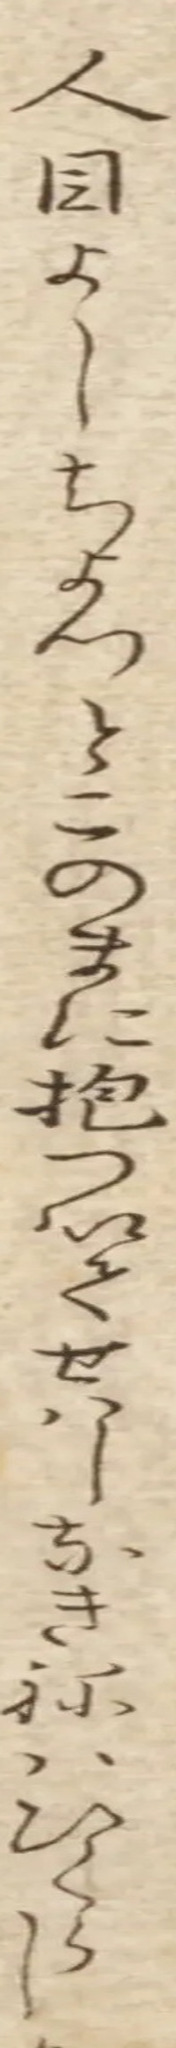人目よしちよつとこのまに抱ついてせはしなきねはひくらしかそも
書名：画本虫ゑらみ
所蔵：国立国会図書館 National Diet Library, JAPAN
